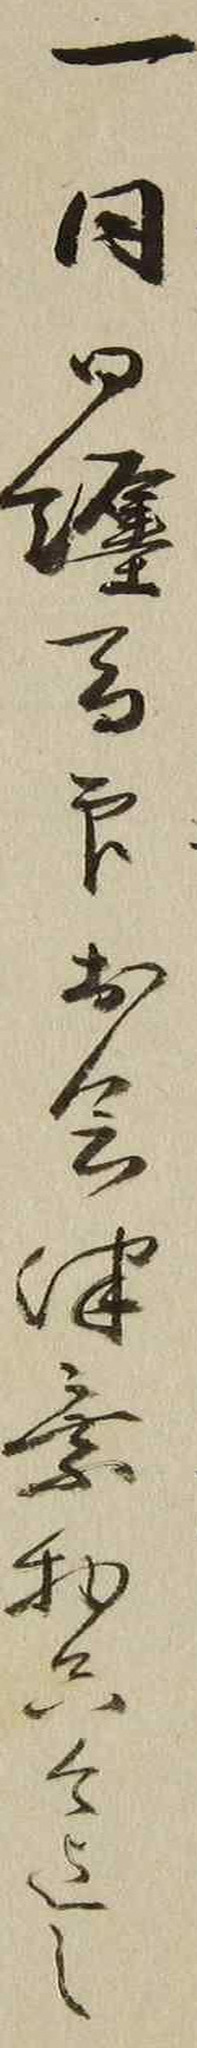一同日纒馬印於会津乗物只今迄之
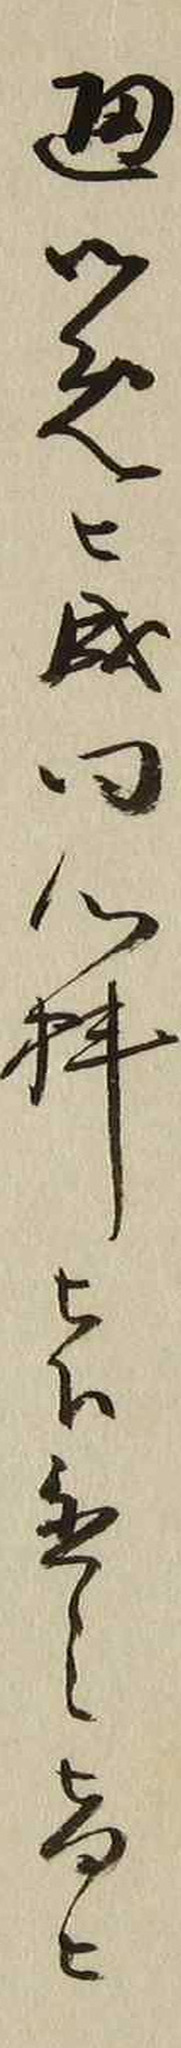通御免被成同心料被下置候旨被
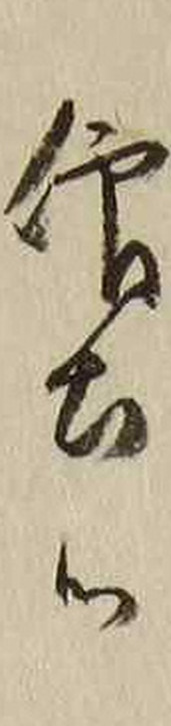仰出候
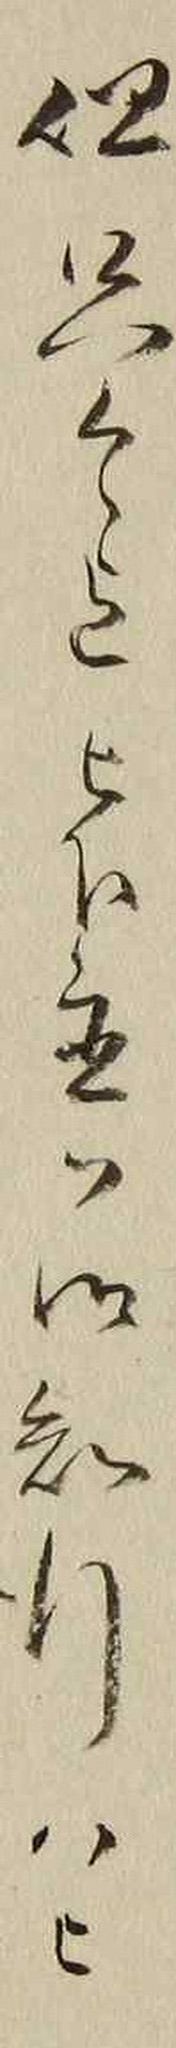但只今迄被下置候御知行は被
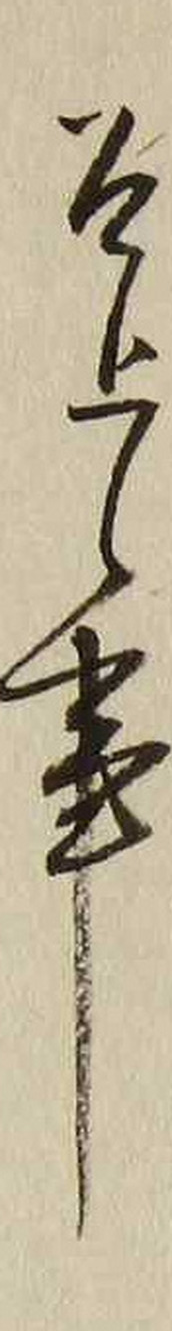召上候事
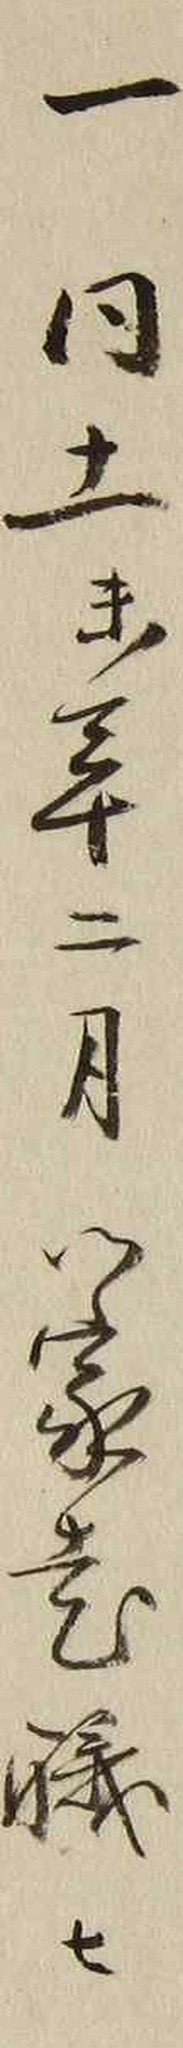一同十一未年二月御家老職被
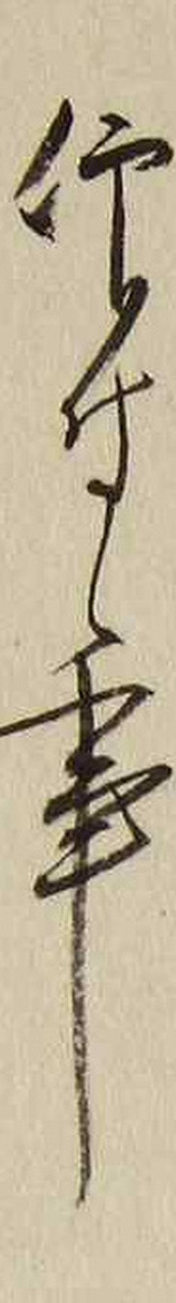仰付候事
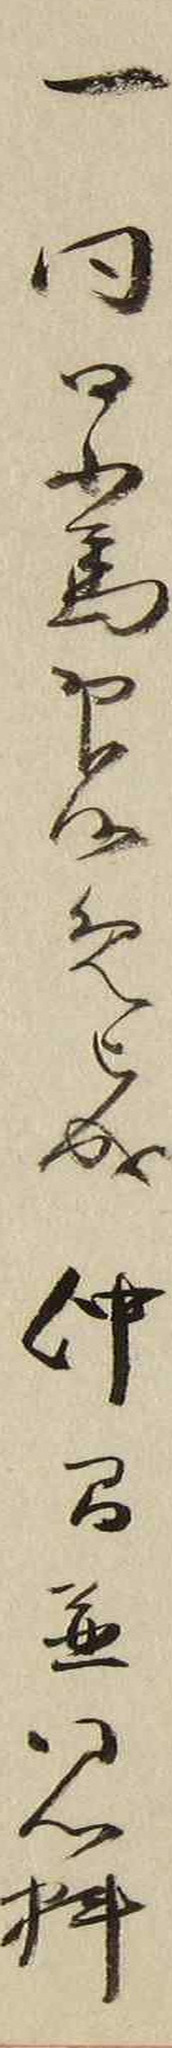一同日小馬印御免被成仲間兼同心料

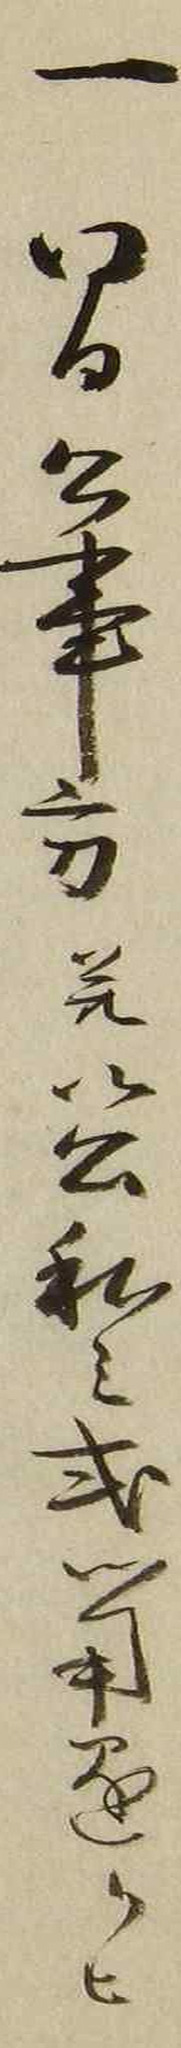一同日公事方并御公私之式御用懸り被
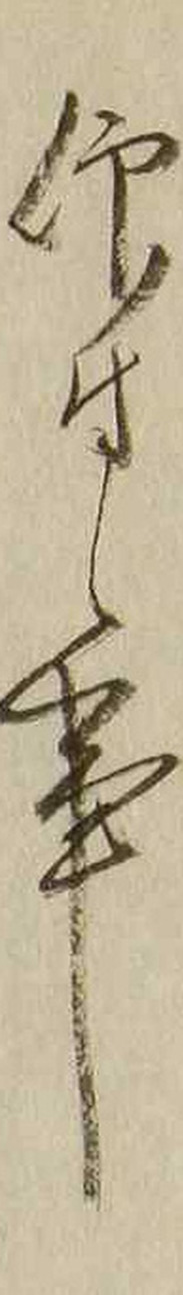仰付候事
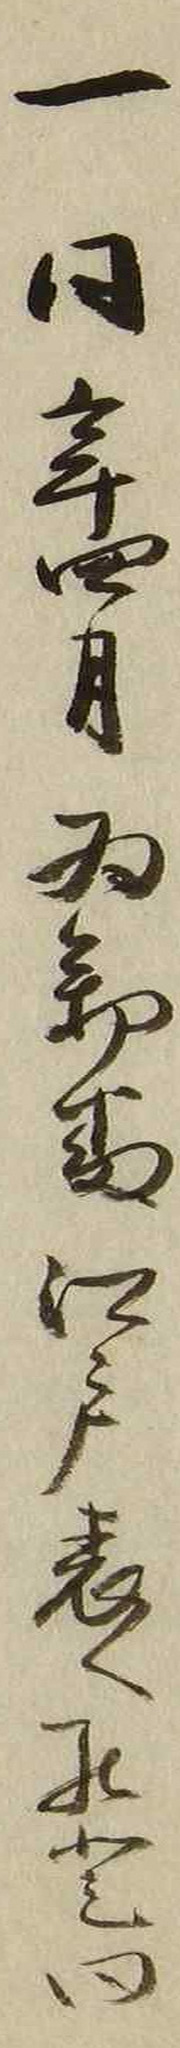一同年四月為勤番江戸表へ罷登同
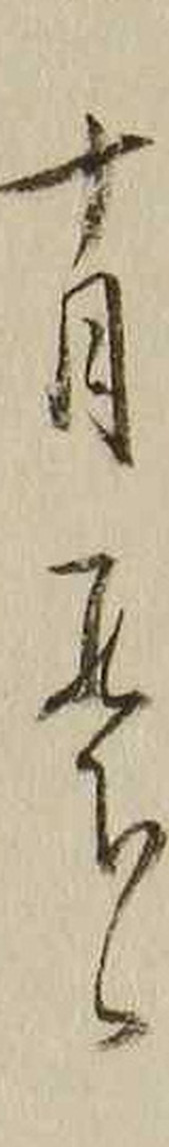十月罷下候
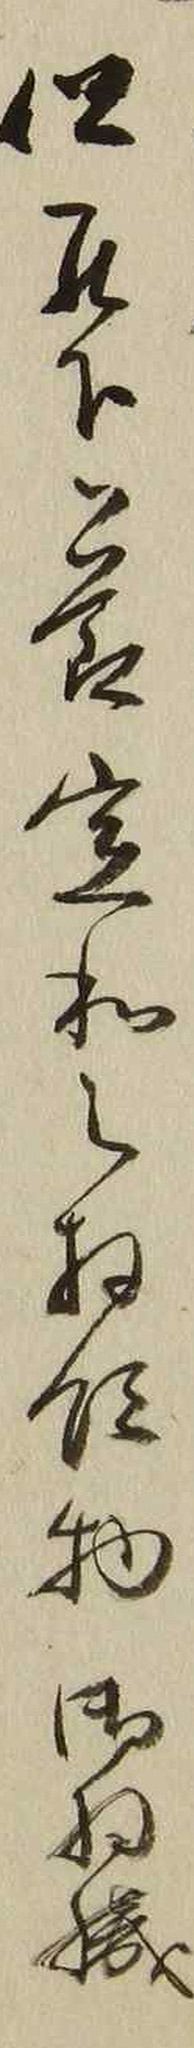但罷下候節定和之拝領物御羽織
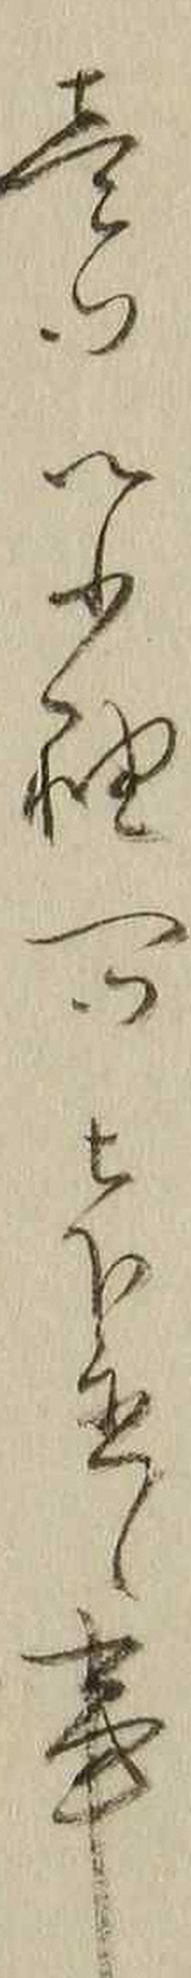壱つ御小袖一つ被下置候事
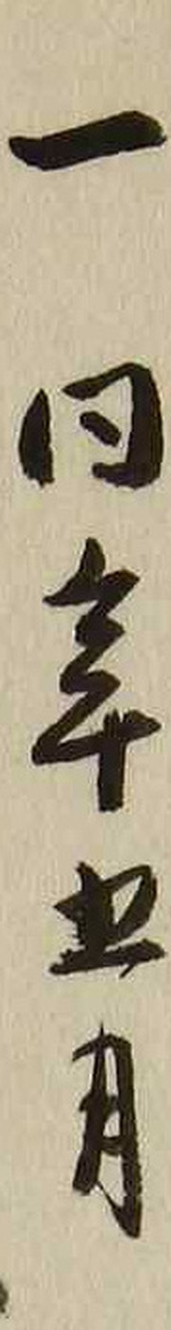一同年五月
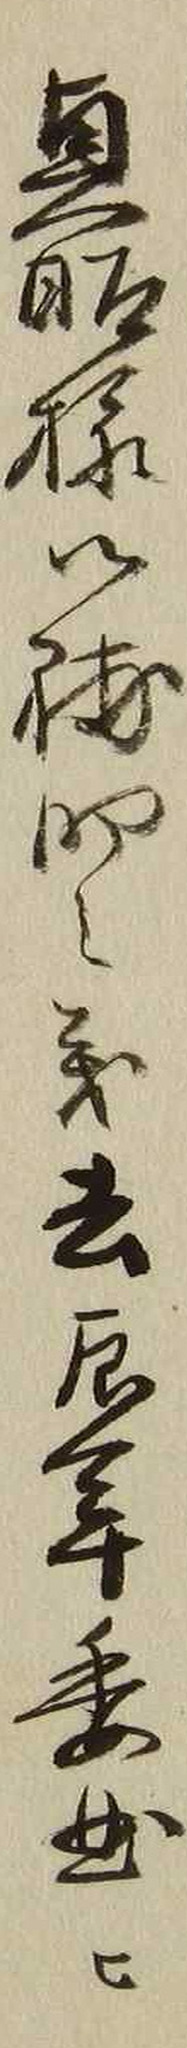貞昭様御補助之義去辰年委曲被
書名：諸士系譜　巻之292　き之部1
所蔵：会津若松市立会津図書館
